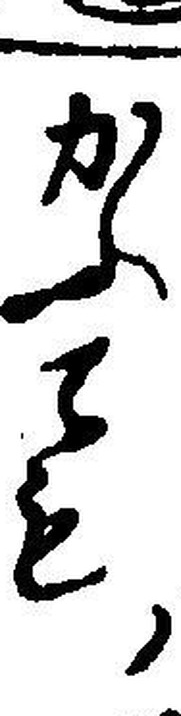かふても
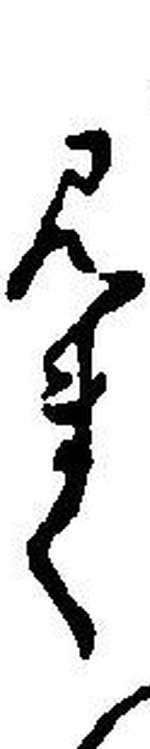みまく
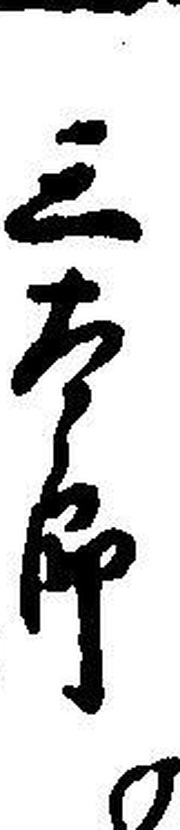三太郎
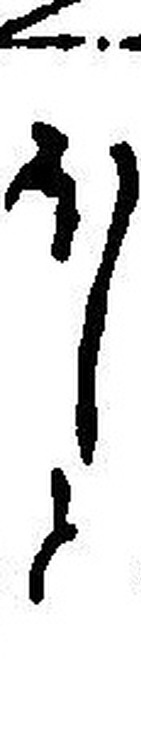ほしと
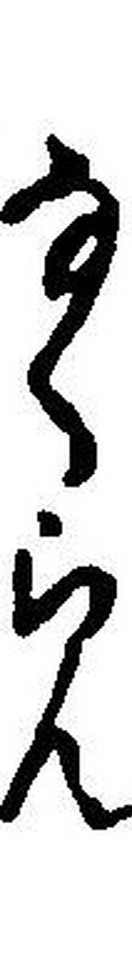なくらん
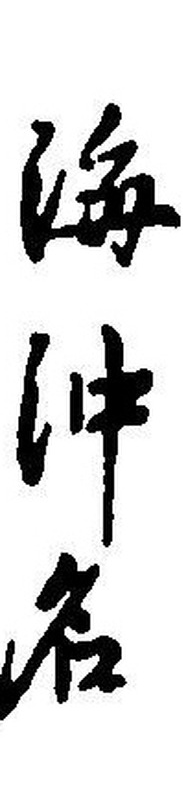海沖名
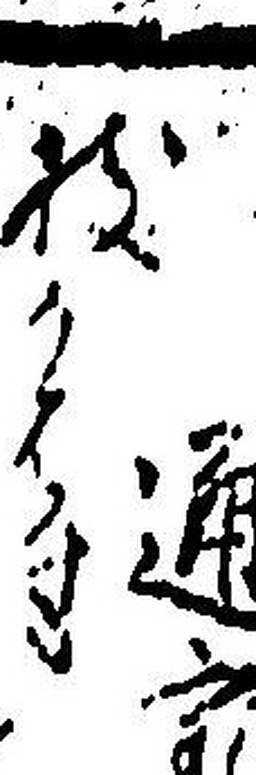枝かはす
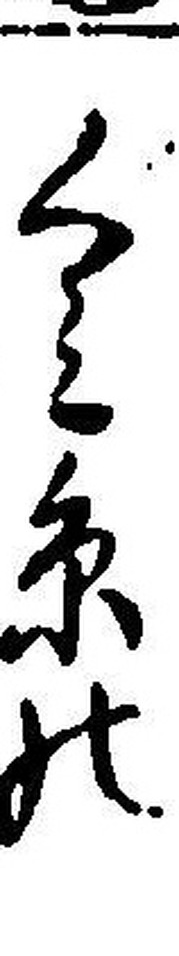くみ糸の
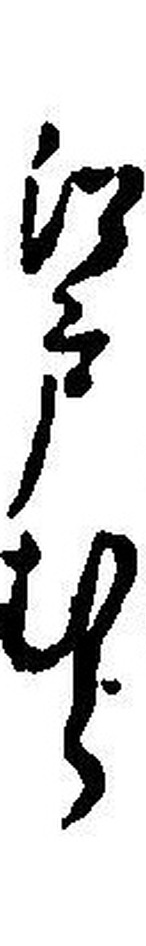江戸むら
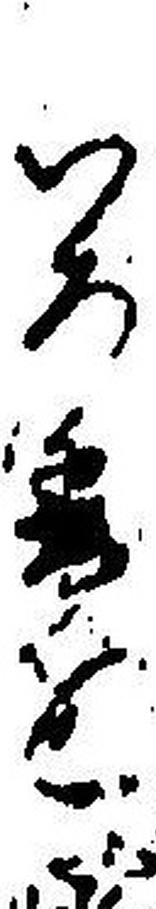いろ香を
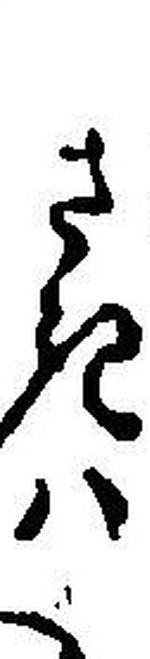さきは
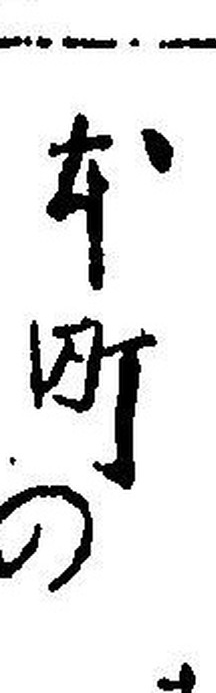本町の
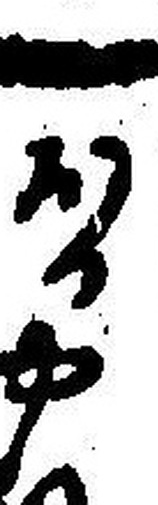よりや
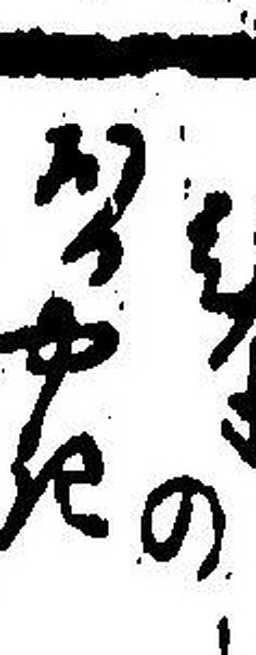おかやき
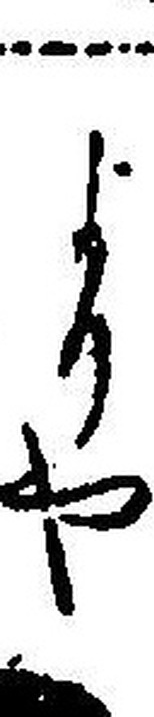よりや

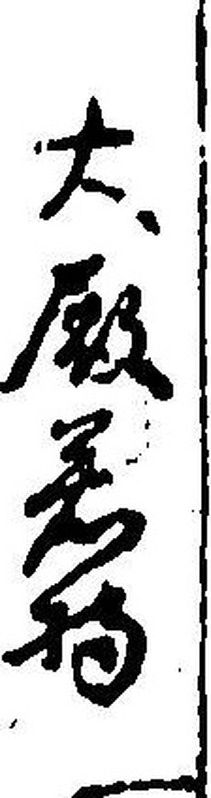大殿若持
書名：どうれ百人一首 / 鹿都部真顔(狂歌堂)編
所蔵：東京大学総合図書館 General Library in the University of Tokyo, JAPAN
